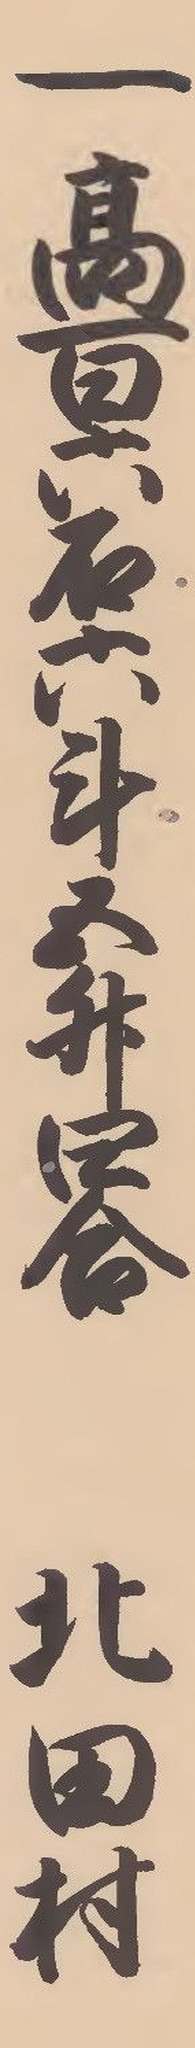一高百六石六斗五升四合北田村
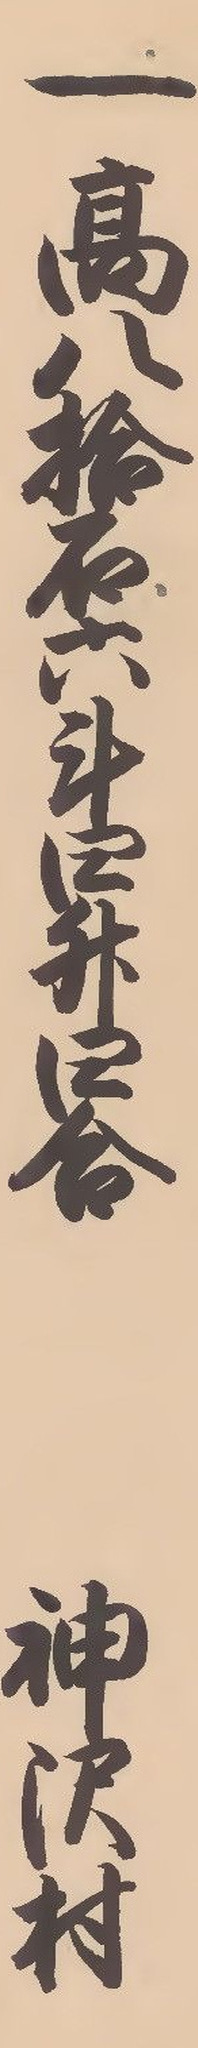一高八拾石六斗四升四合神沢村
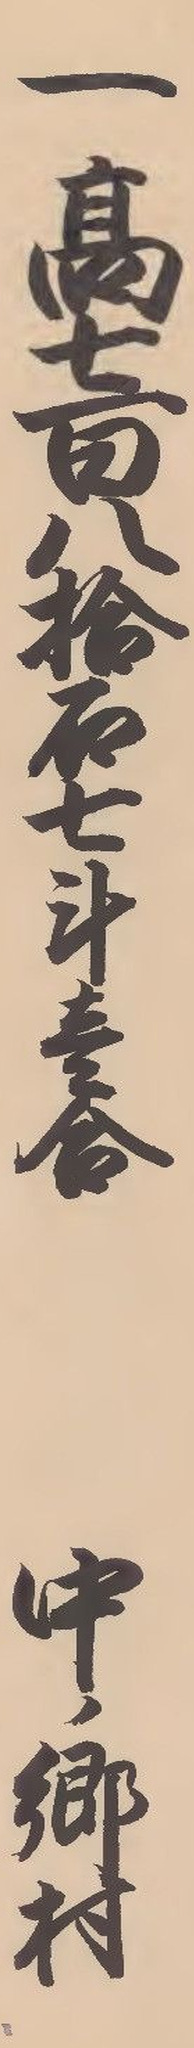一高七百八拾石七斗壱合中ノ郷村
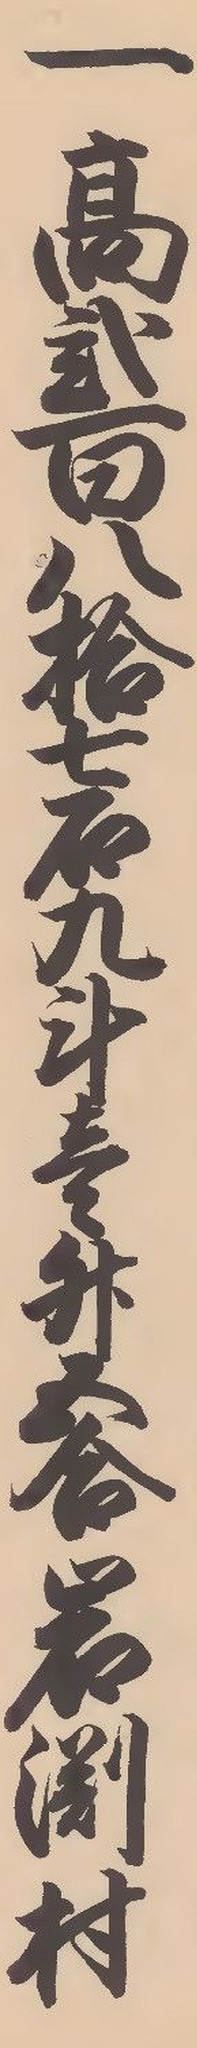一高弐百八拾七石九斗壱升五合岩渕村
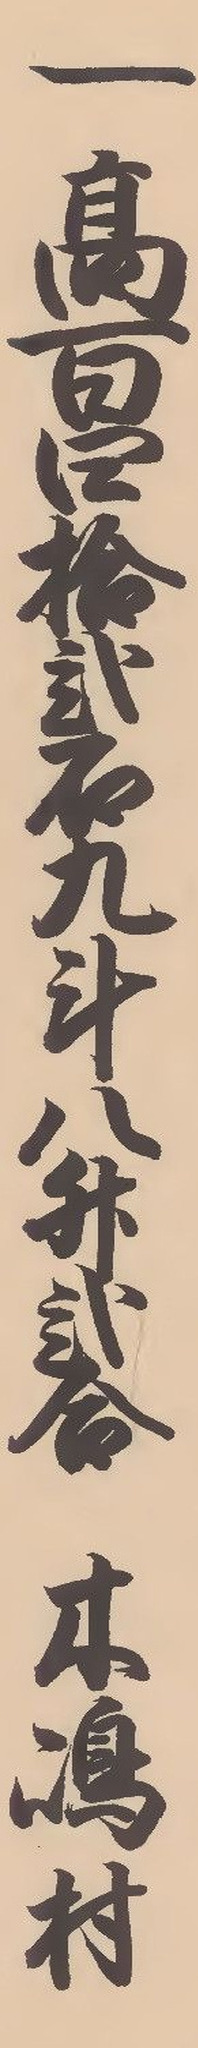一高百四拾弐石九斗八升弐合木島村
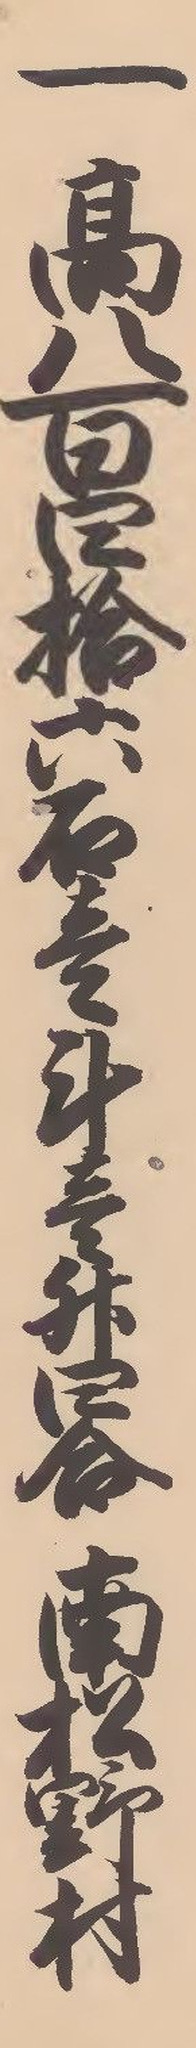一高八百四拾六石壱斗壱升四合南松野村

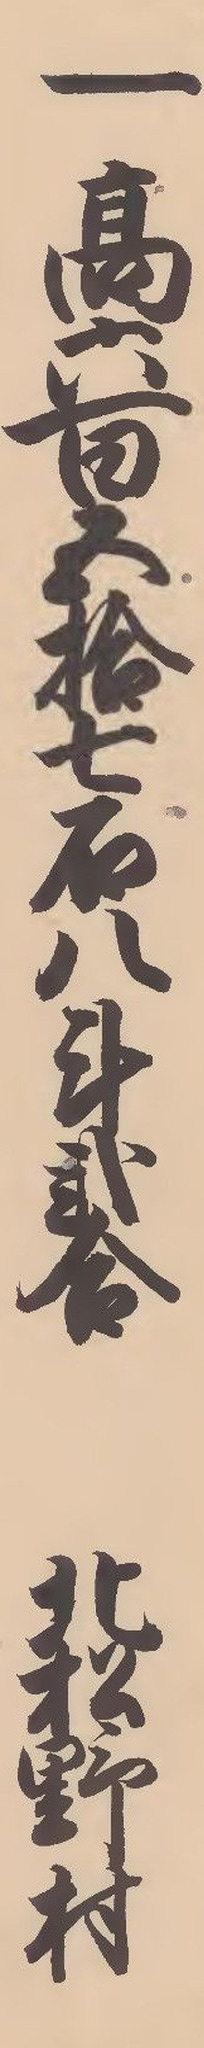一高六百五拾七石八斗弐合北松野村
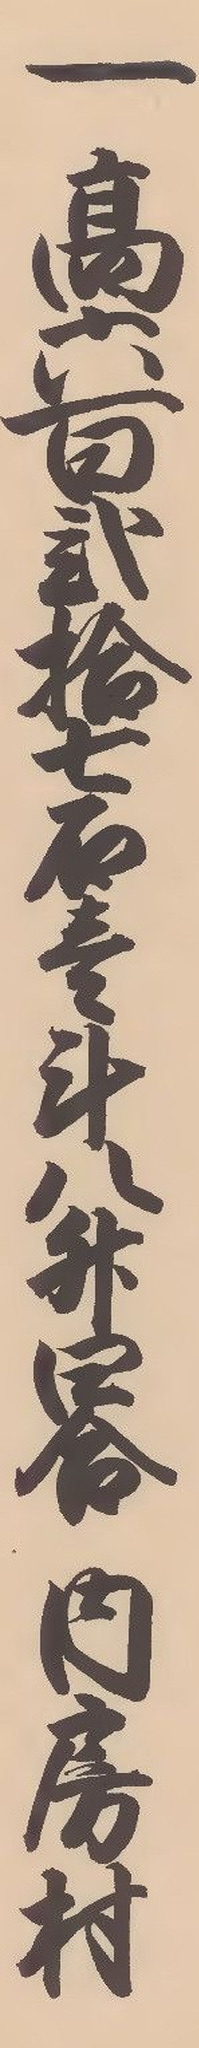一高六百弐拾七石壱斗八升四合内房村
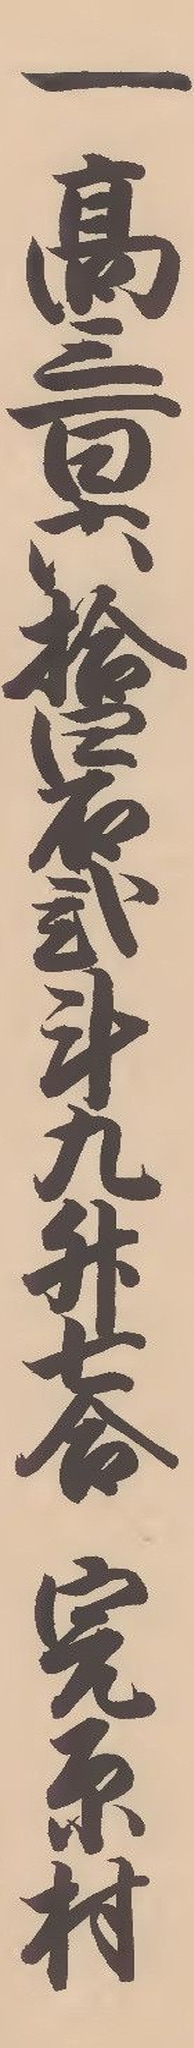一高三百六拾四石弐斗九升七合宍原村
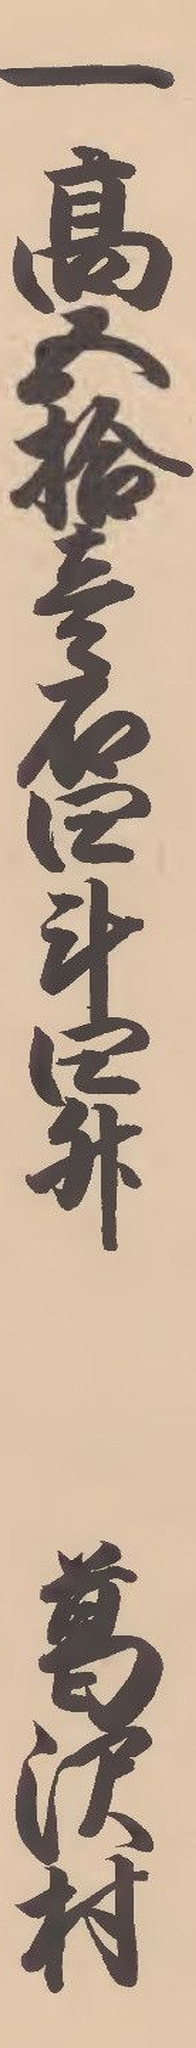一高五拾壱石四斗四升葛沢村
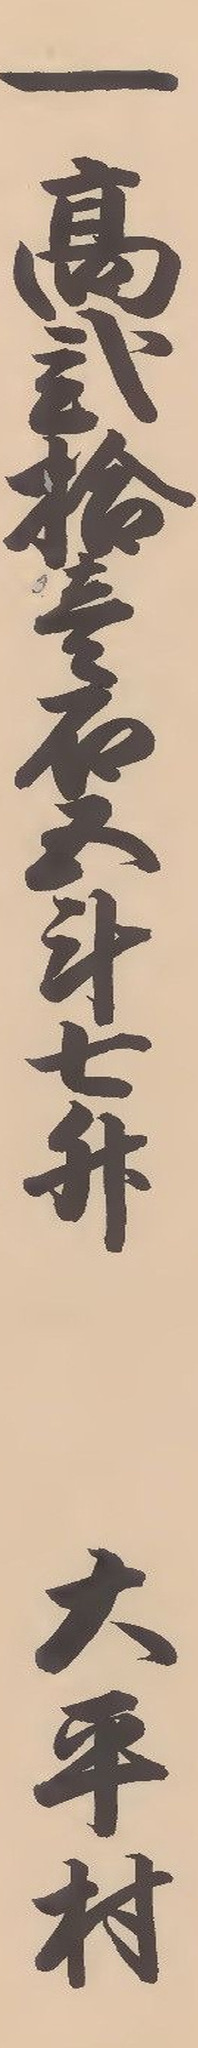一高弐拾壱石五斗七升大平村
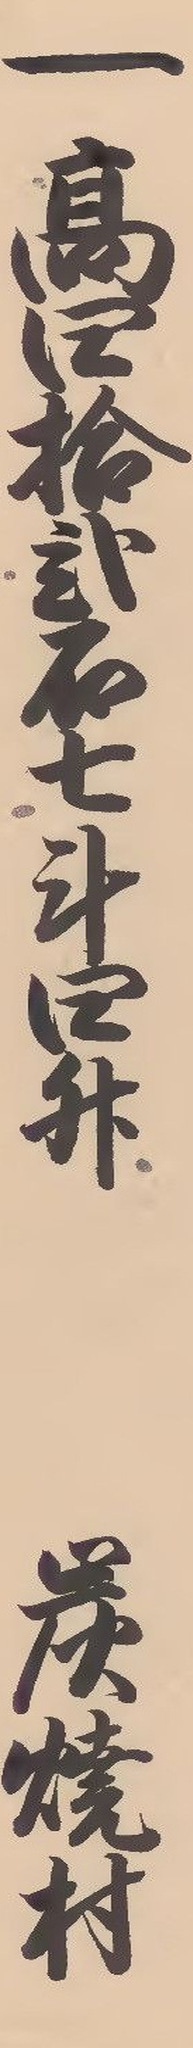一高四拾弐石七斗四升炭焼村

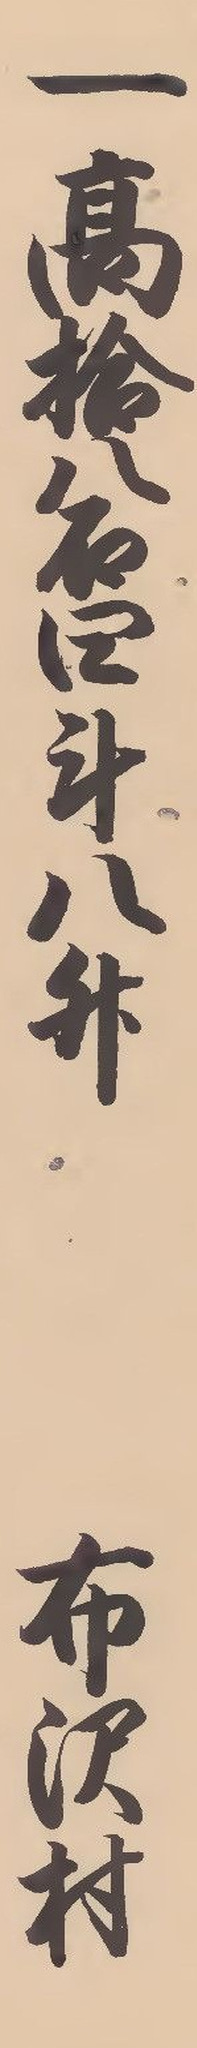一高拾八石四斗八升布沢村
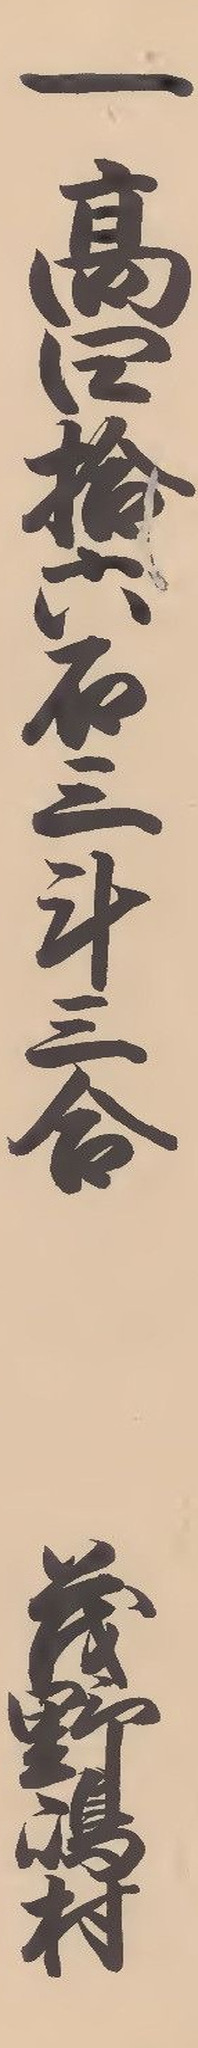一高四拾六石三斗三合茂野島村
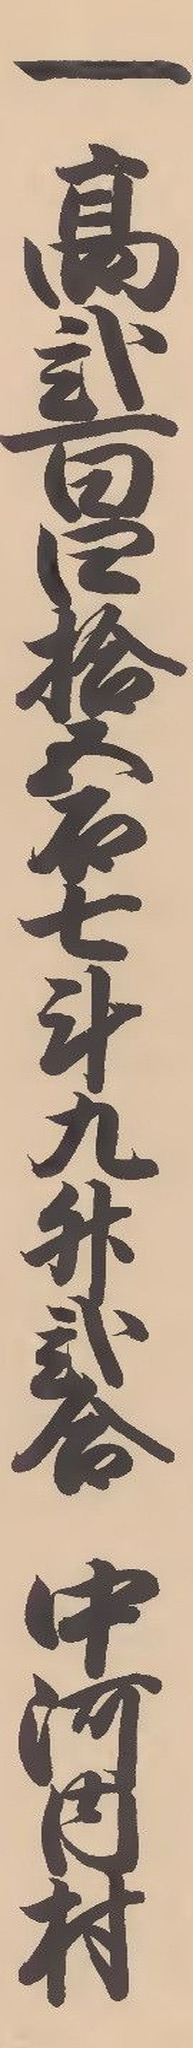一高弐百四拾五石七斗九升弐合中河内村
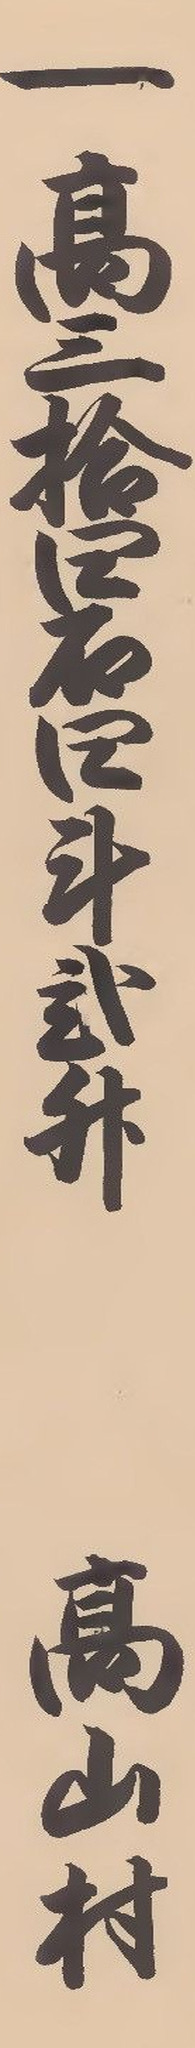一高三拾四石四斗弐升高山村
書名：駿河国郷帳
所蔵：国立公文書館 National Archives of Japan
